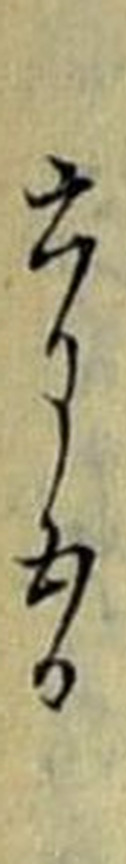六月五日
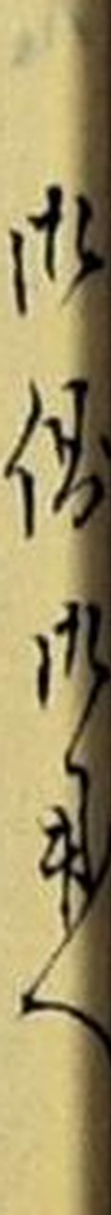御側御用人
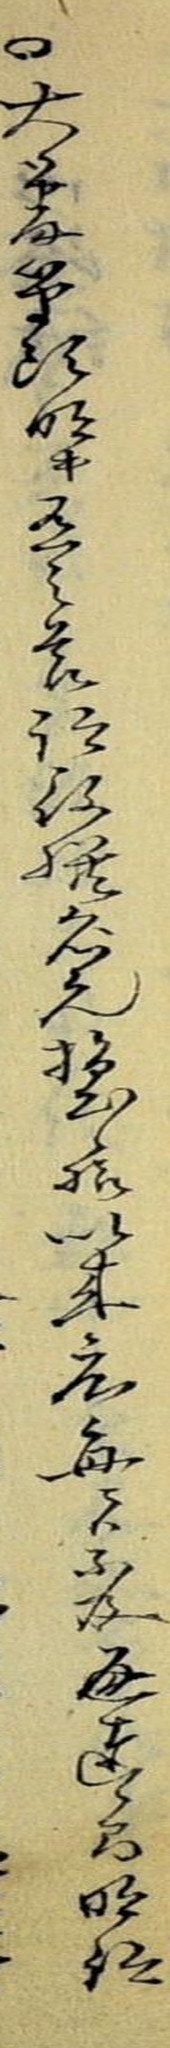○大御番筆頭明キ有之節跡役選名元指出候様以来度毎には不及通達候間明跡
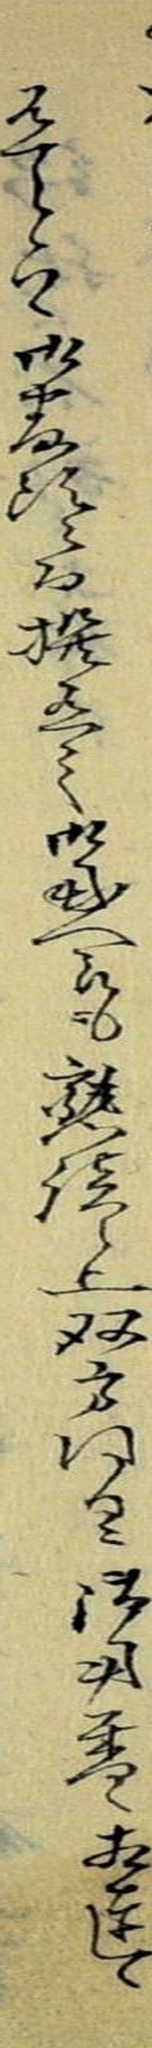有之候はヽ御番頭に而選有之御用人江も熟談之上双方同日に御用番へ相達候
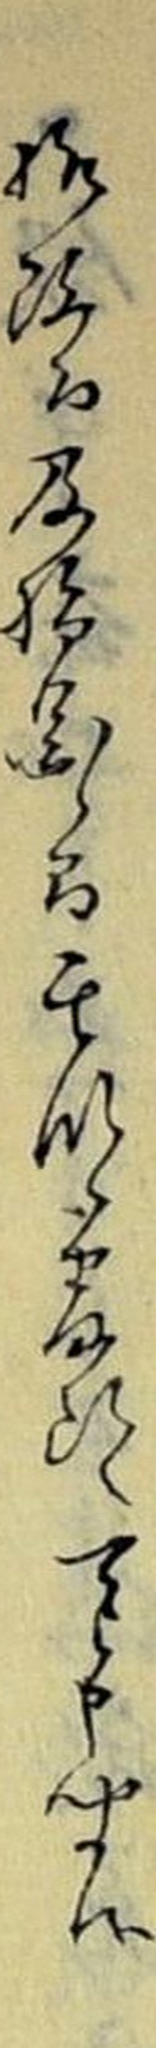様改而及指図候間其段御番頭へ可被申聞候
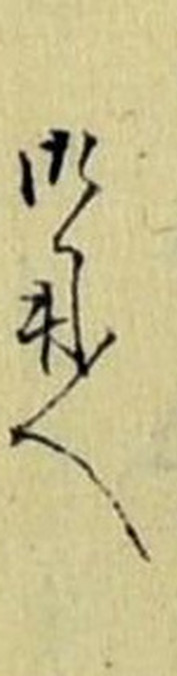御用人
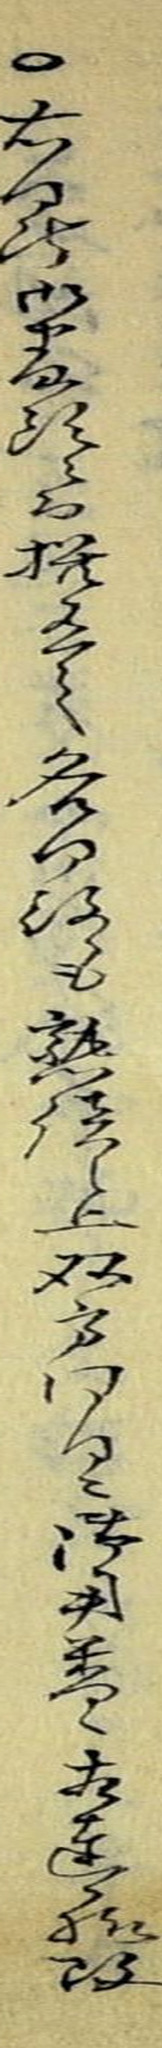○右同断御番頭に而選有之各同役へも熟談之上双方同日に御用番へ相達候様改
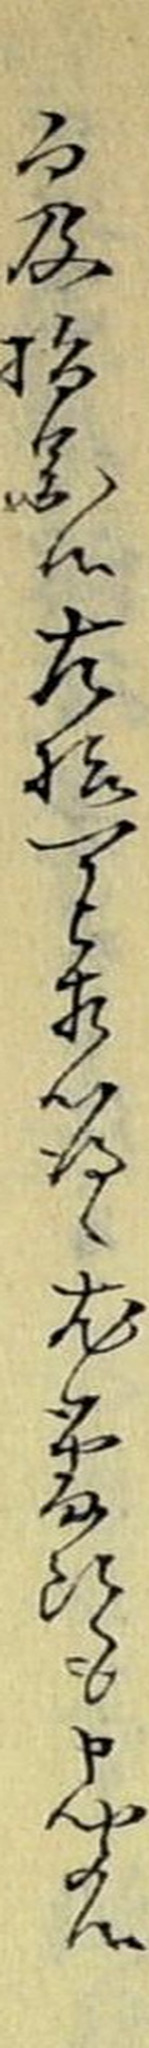而及指図候左様可被相心得候尤番頭へも申聞候
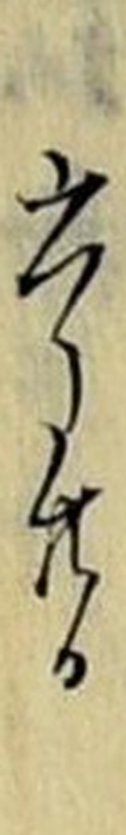六月廿日
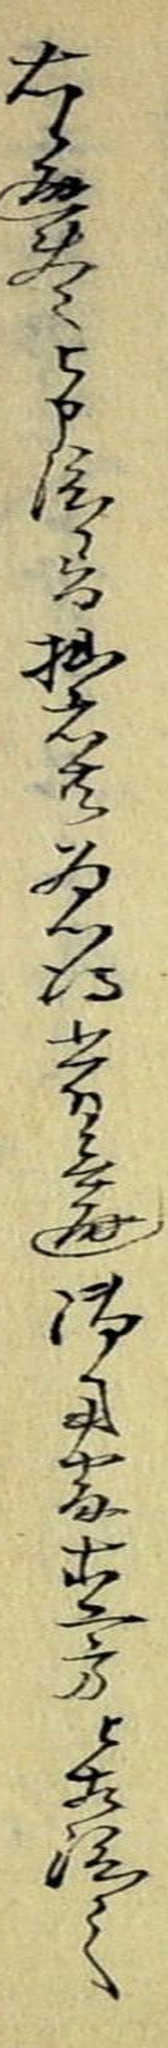右之通夫々被申渡候旨拙者共為心得書付壱通御用番木工方被相渡之
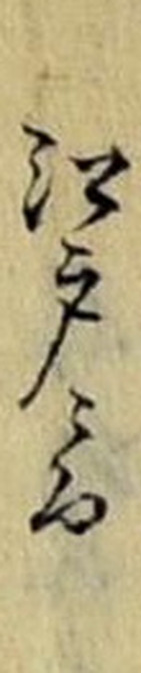江戸に而
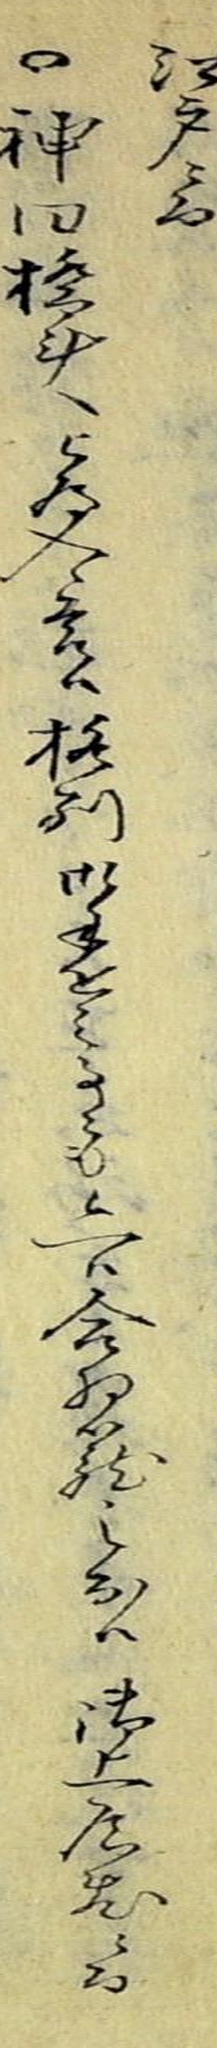○神田橋斗へ被為入候節は格別御手近之事にも候へは合羽籠之分は御上屋敷に而
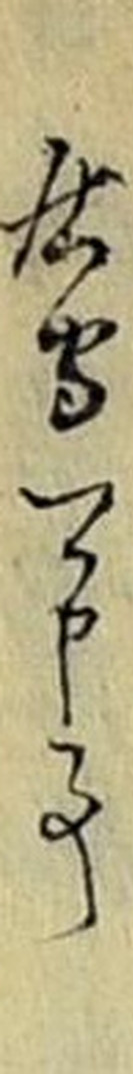居守可申事
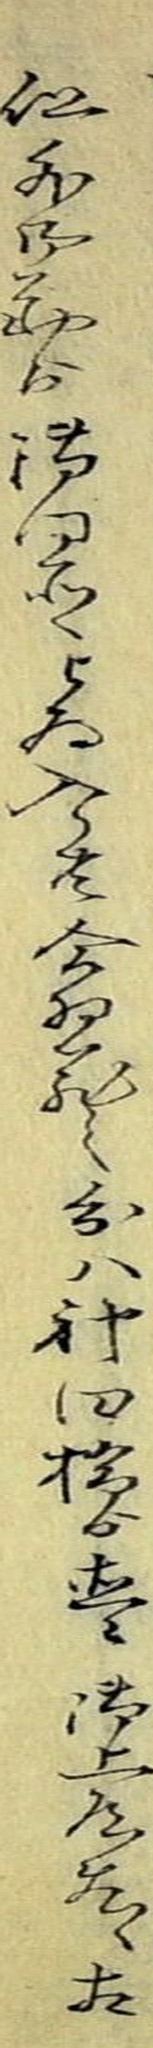但外御勤ゟ御同所へ被為入候共合羽籠之分は神田橋ゟ直々御上屋敷へ相
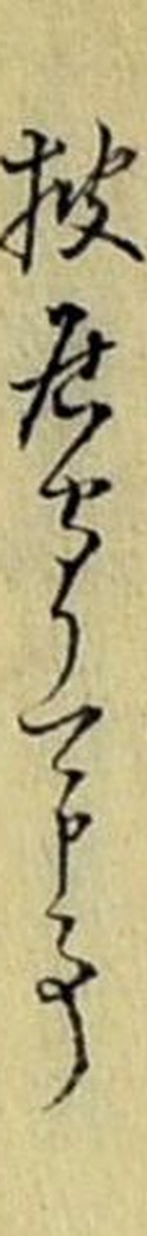披居守り可申候
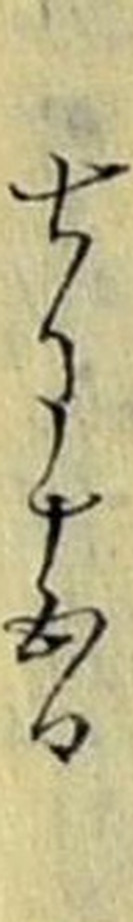七月十五日
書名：命令之部 六
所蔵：福井県文書館 Fukui Prefectural Archives
